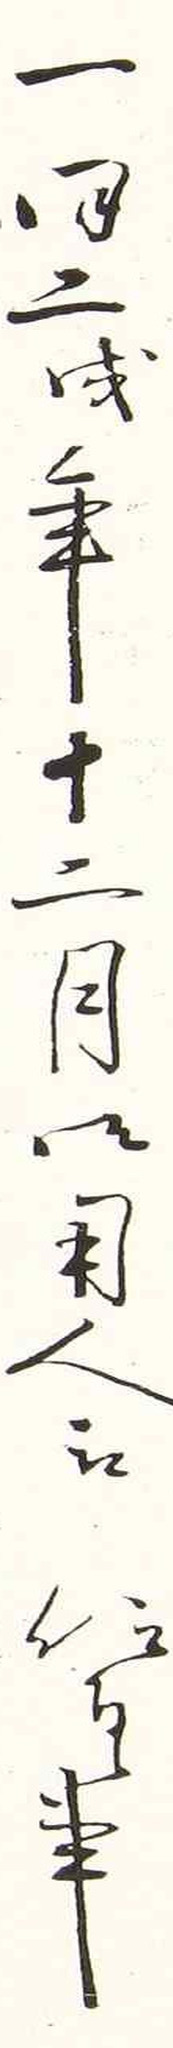一同二戌年十二月御用人被仰付候事
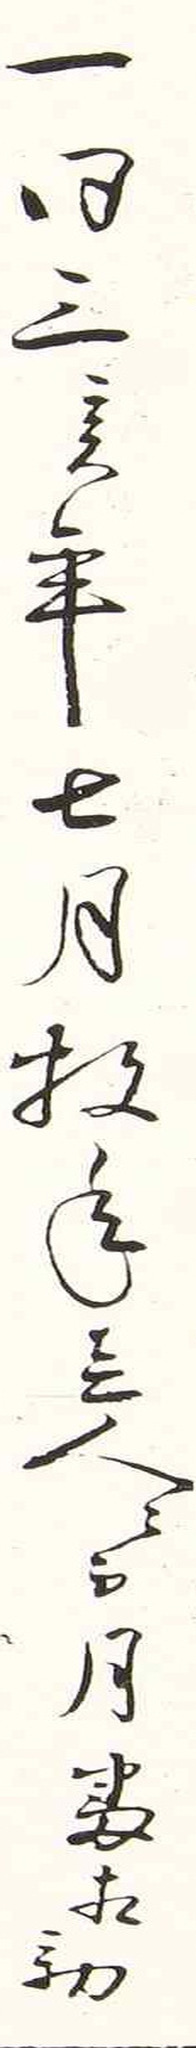一同三亥年七月数年壱人ニ而月番相勤
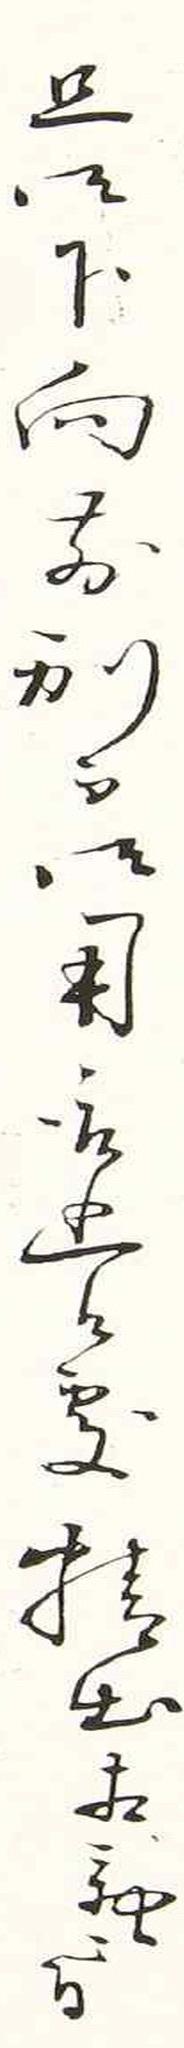且御下向前別而御用取込候処精出相勤候ニ付
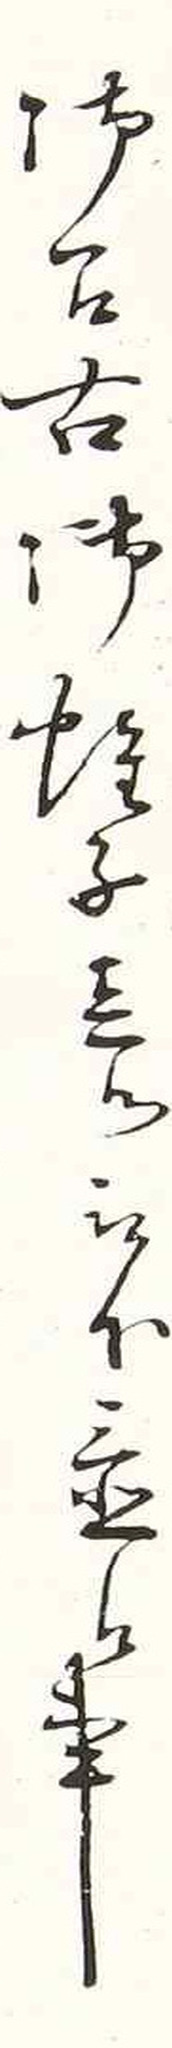御召古御帷子壱ツ被下置候事
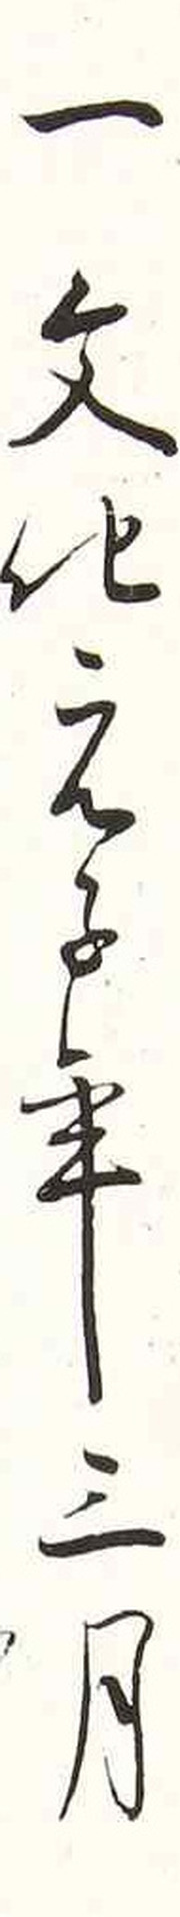一文化元子年三月
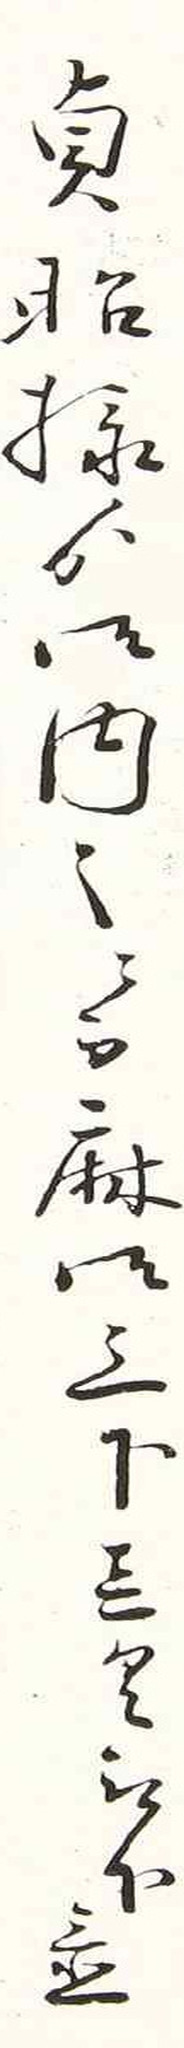貞昭様ゟ御内々ニ而麻御上下壱具被下置
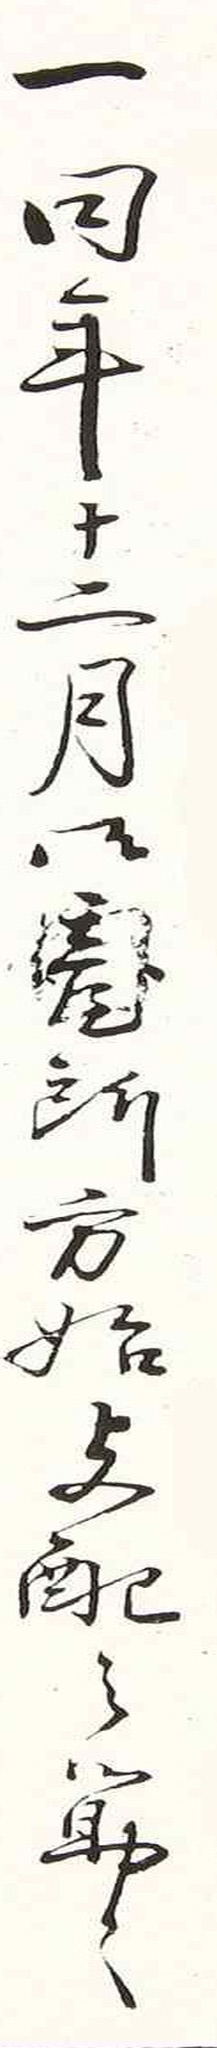一同年十二月御台所方始支配之筋之
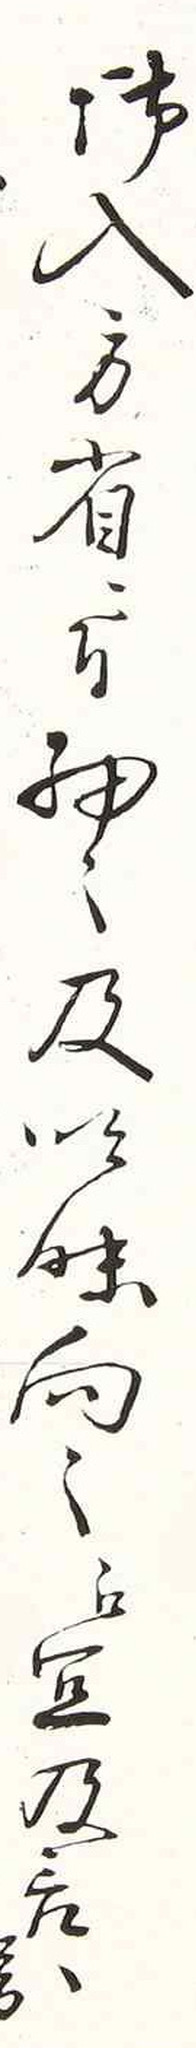御入方有ニ付細々及吟味向々江宜及差図
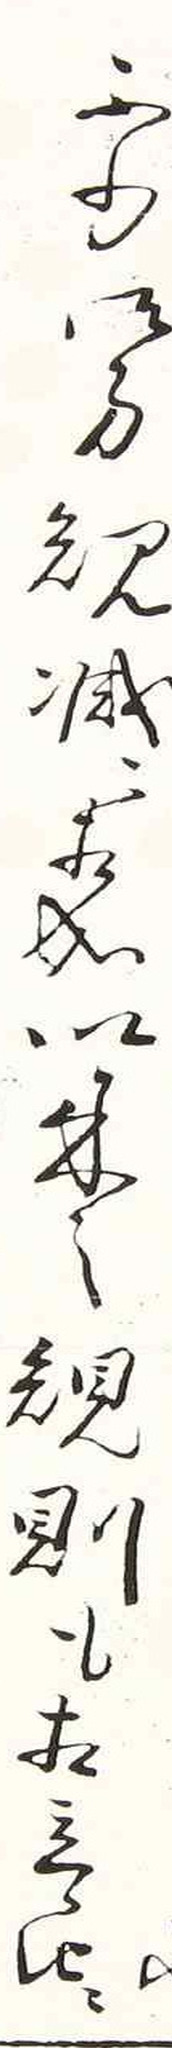不少御方規減ニ相成以来之規則も相立候由ニ
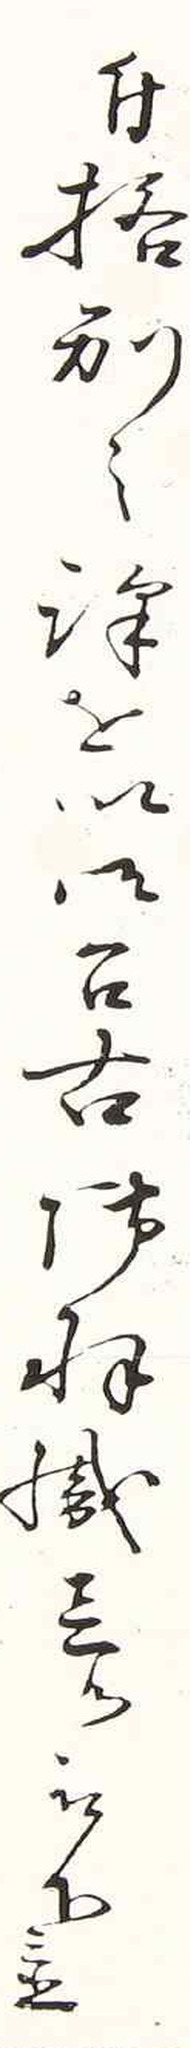付格別之評を以御召古御羽織壱ツ被下置
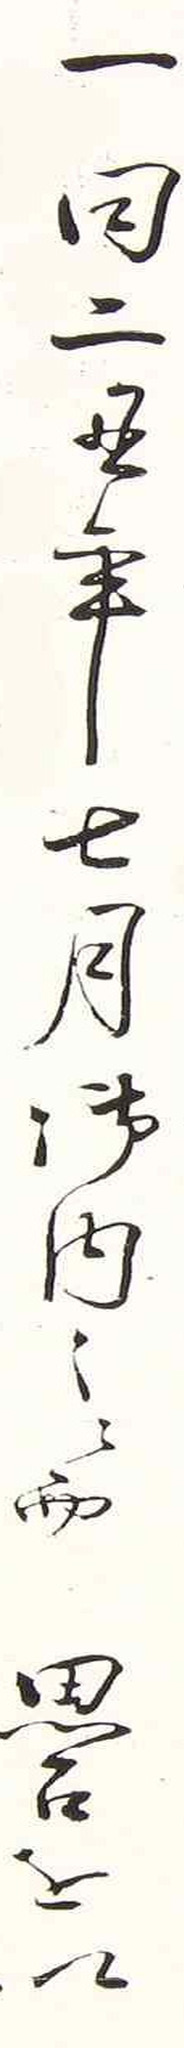一同二丑年七月御内々ニ而思召を以
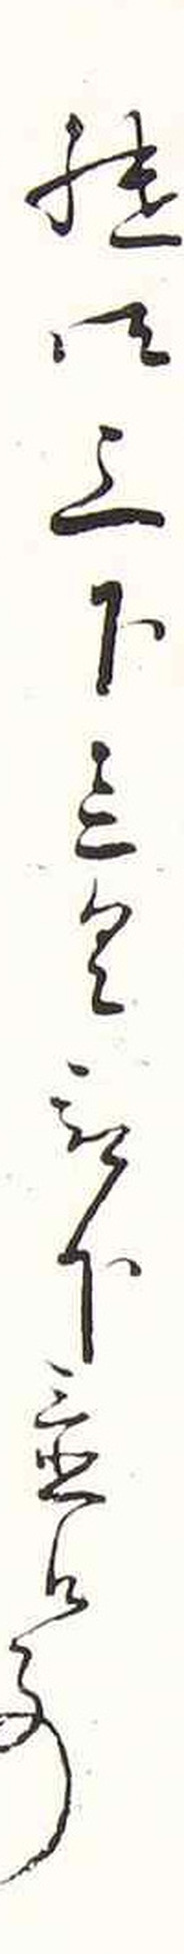継御上下壱具被下置候事
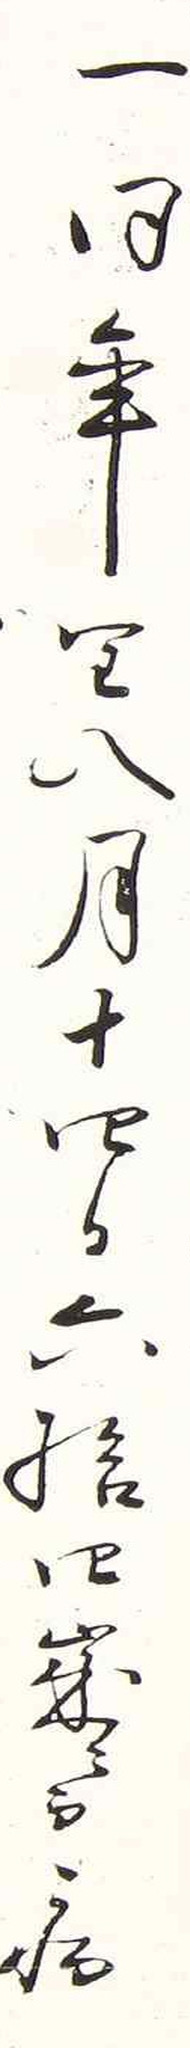一同年閏八月十四日六拾四歳ニ而病
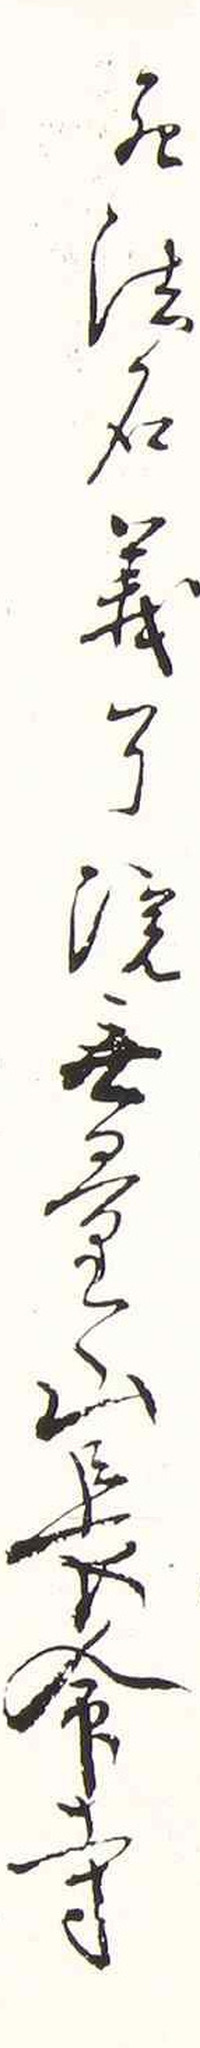死法名義了院無量山長命寺
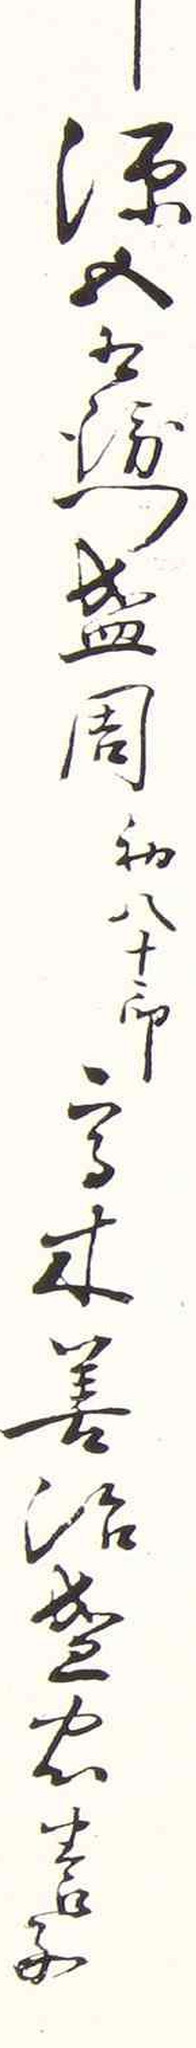源五右衛門盛周初八十郎高木善治盛忠養子

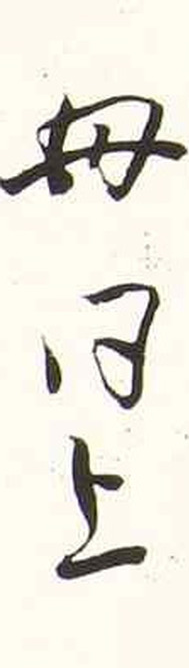母同上
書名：諸士系譜　巻之357　す之部7
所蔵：会津若松市立会津図書館
